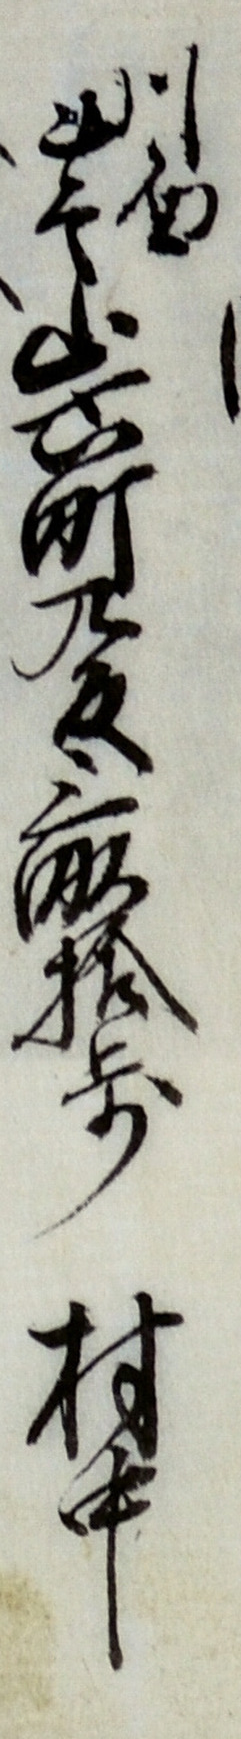芝山六町九反三畝拾歩村中
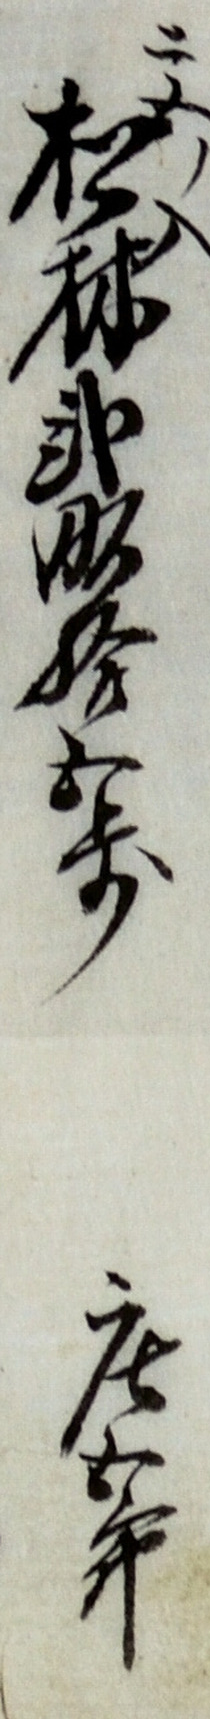松林弐畝拾五歩庄五郎
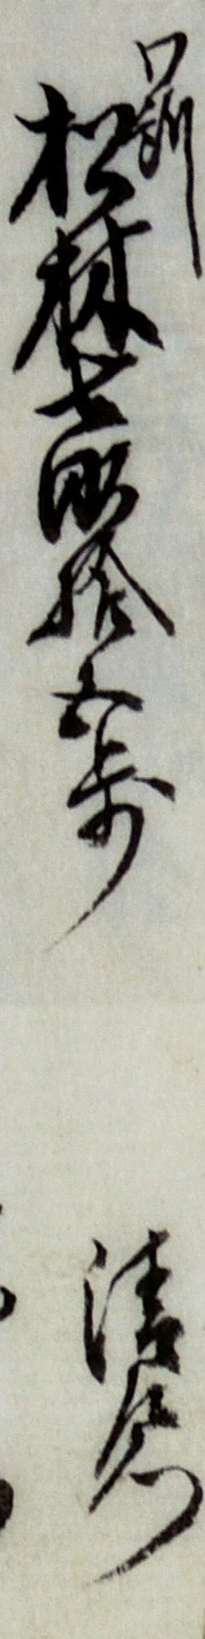松林七畝拾五歩清左衛門
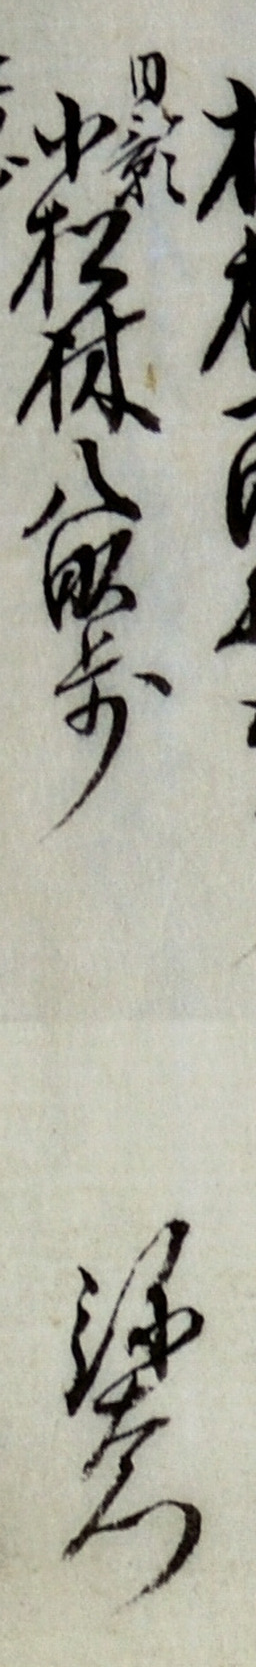小松林八畝歩弥左衛門
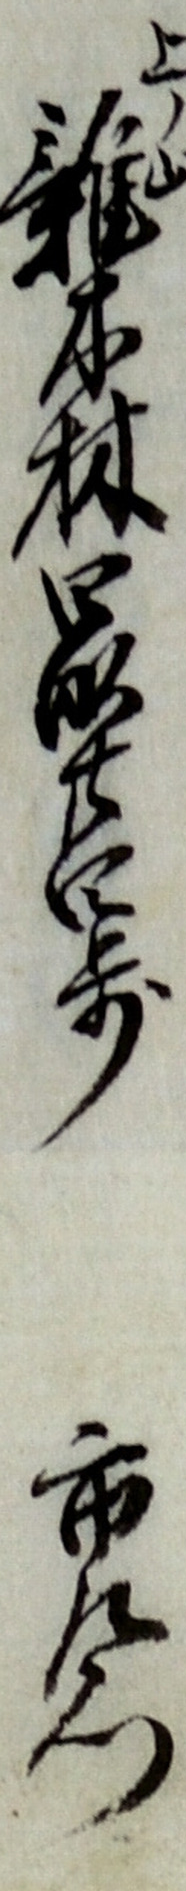雑木林四畝廿四歩市左衛門

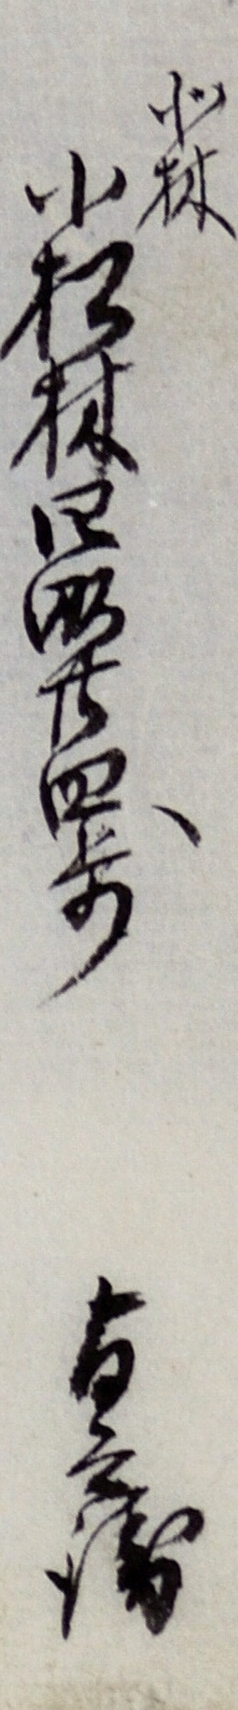小松林四畝廿四歩与兵衛
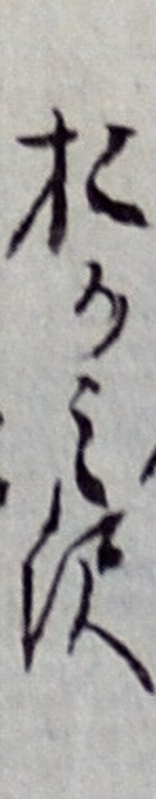おかみ沢
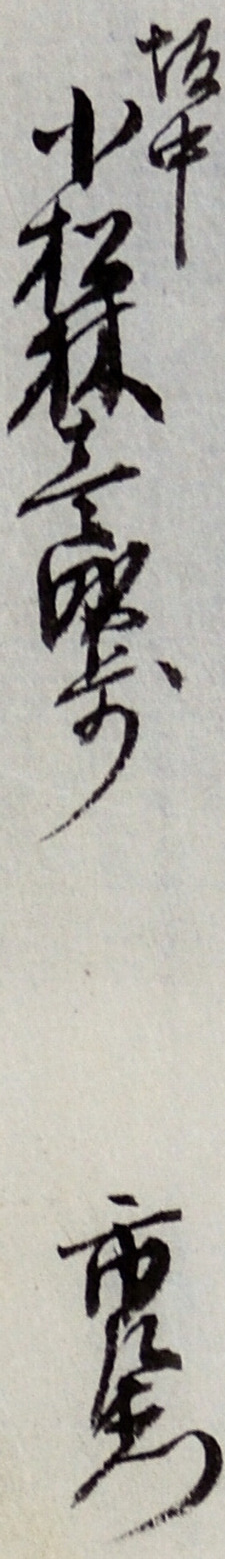小松林壱畝歩市左衛門
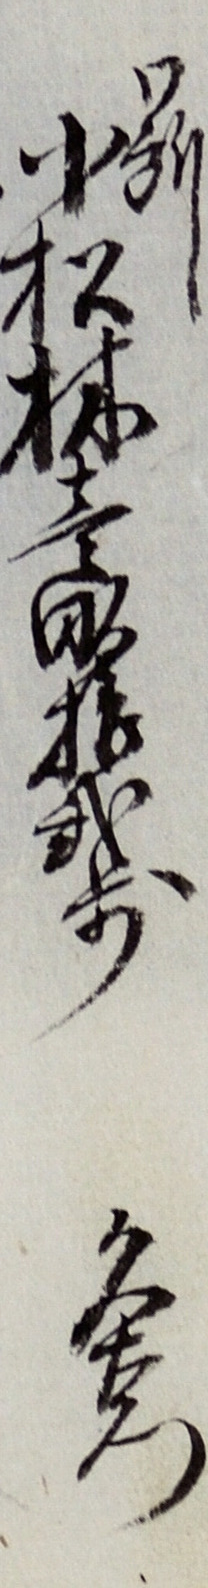小松林壱畝拾弐歩久右衛門
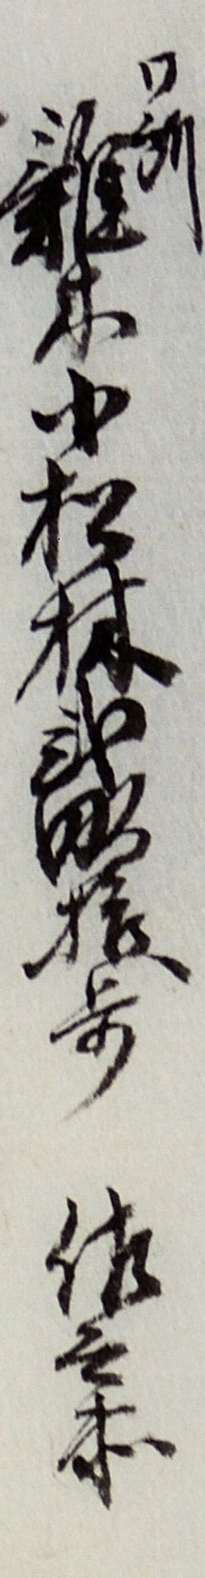雑木小松林弐畝拾歩佐兵衛
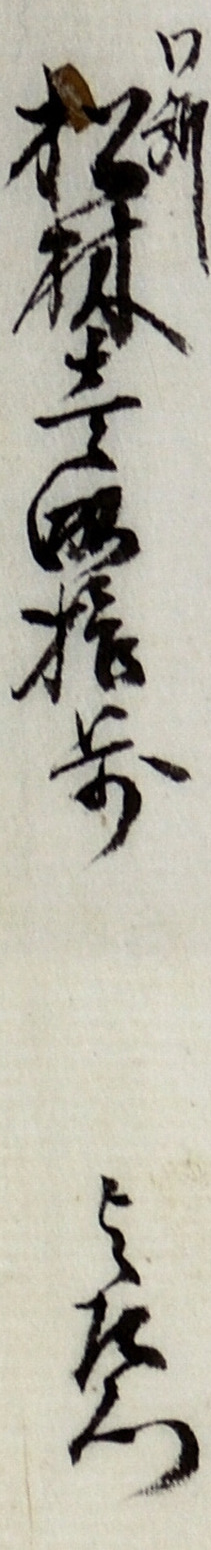松林壱畝拾歩与左衛門
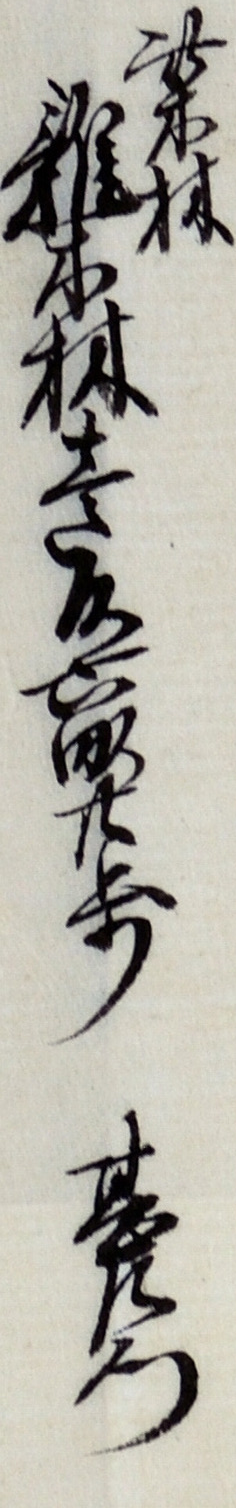雑木林壱反六畝廿歩甚左衛門
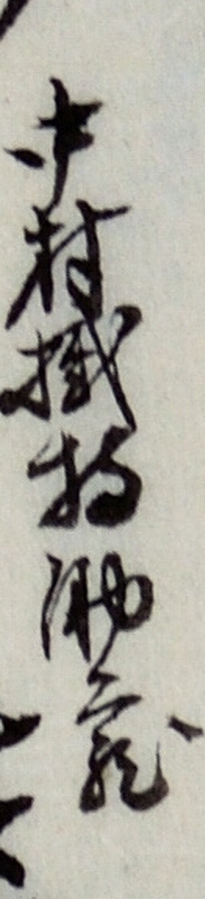中村掛持助蔵
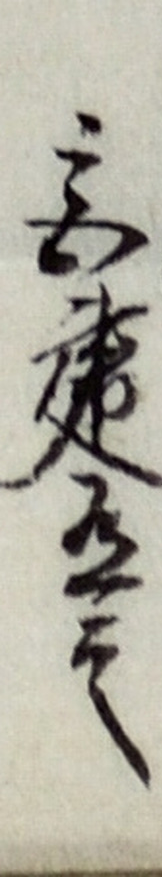宮建有之
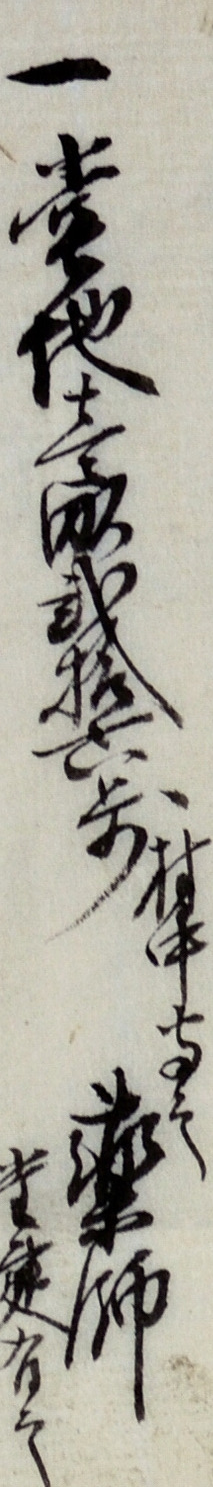一堂地壱畝弐拾六歩薬師
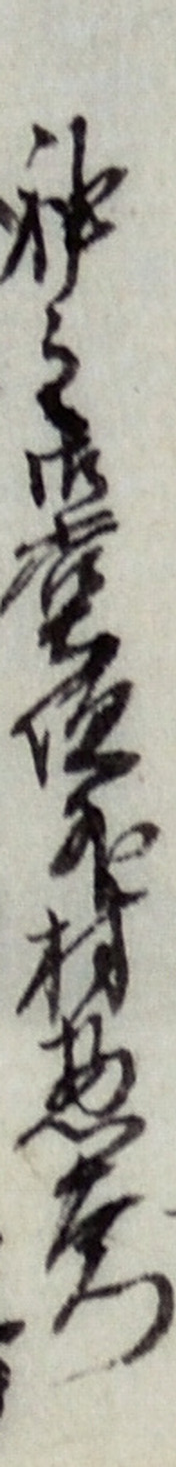神主御堂垣外村惣右衛門
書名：御領分中山林社地手控
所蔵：伊那市立高遠町図書館・合同会社AMANE
